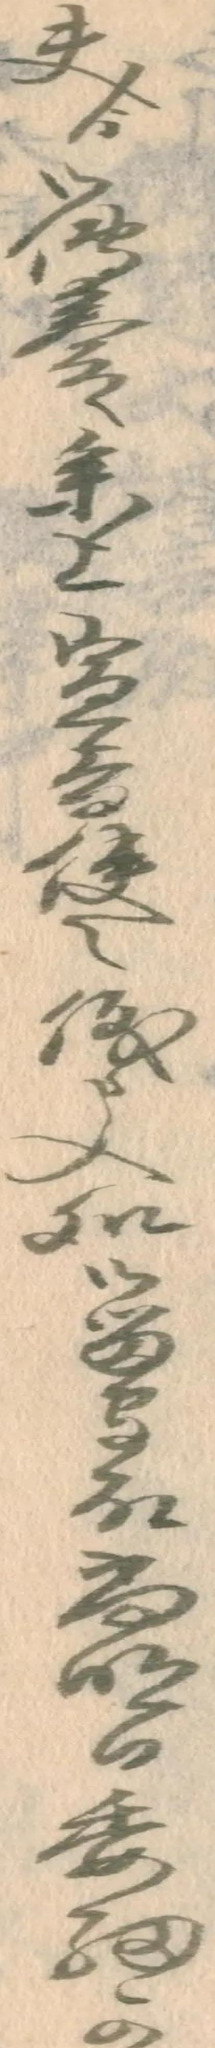夫ゟ御伝奏へ参上宣旨使之儀申入処御留守故尚明日委細可
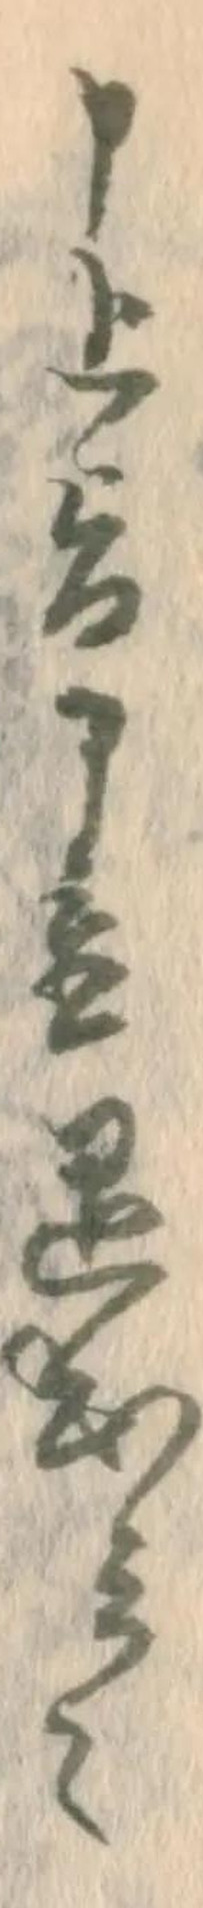申上旨申置退出云々
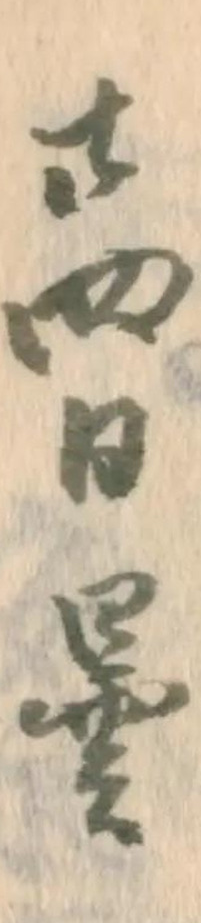廿四日曇
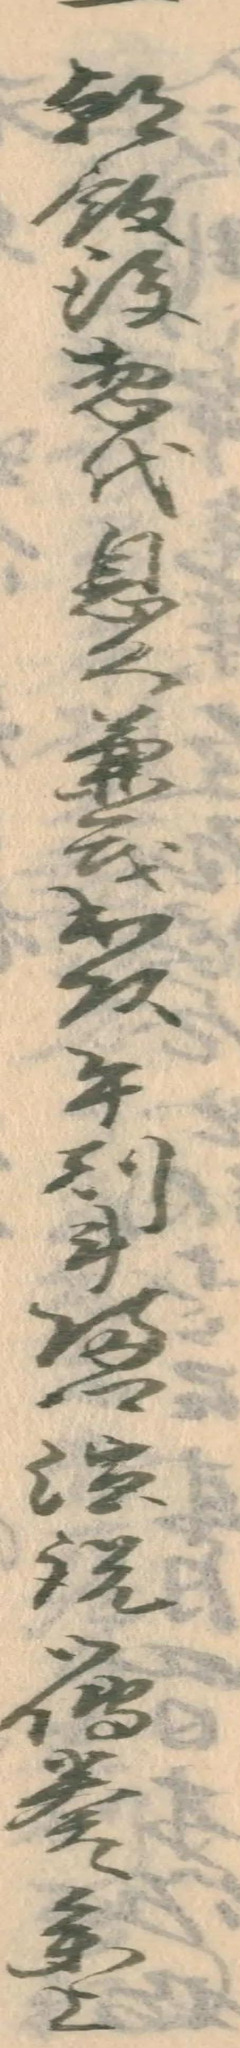一朝飯後惣代息久兼茂出頭午刻計帰郷演説御伝奏へ参上
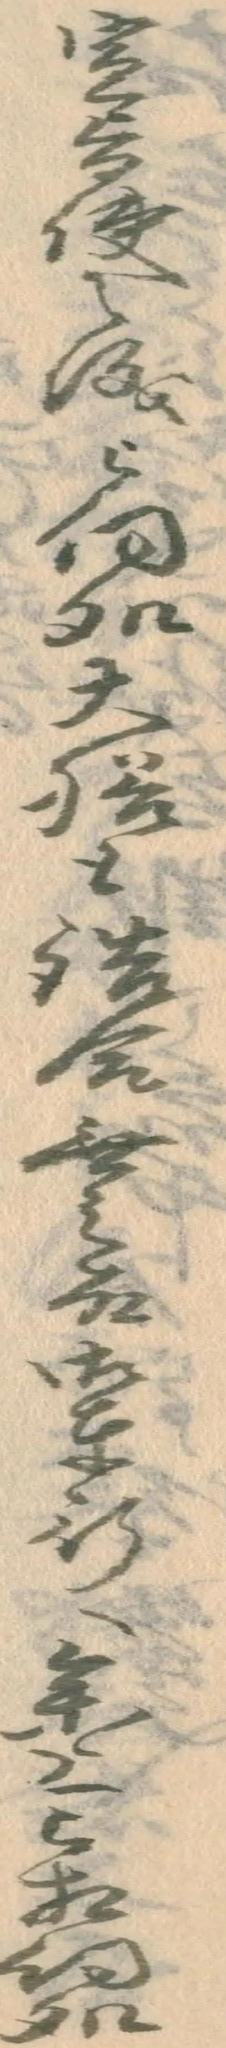宣旨使之儀被伺処大膳も詰合無之故御奉行へ参上被相伺処
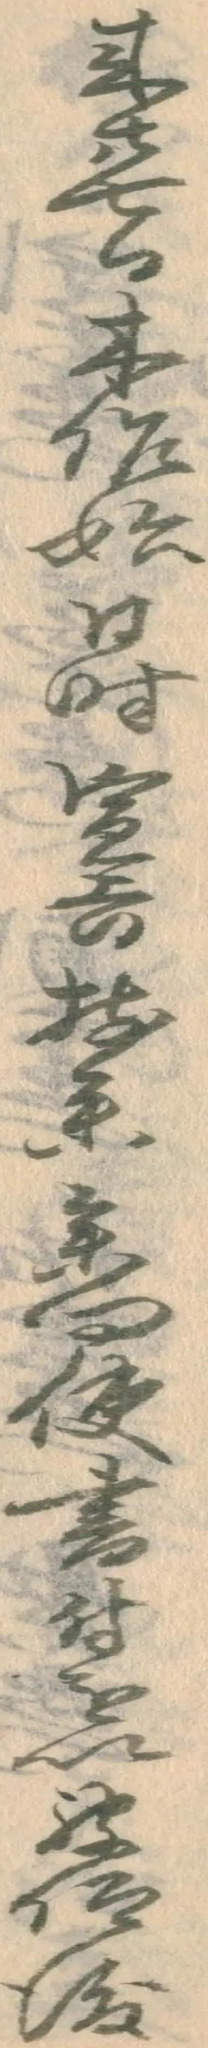来廿七日木作始日時宣旨持参参向使書付を以被仰渡
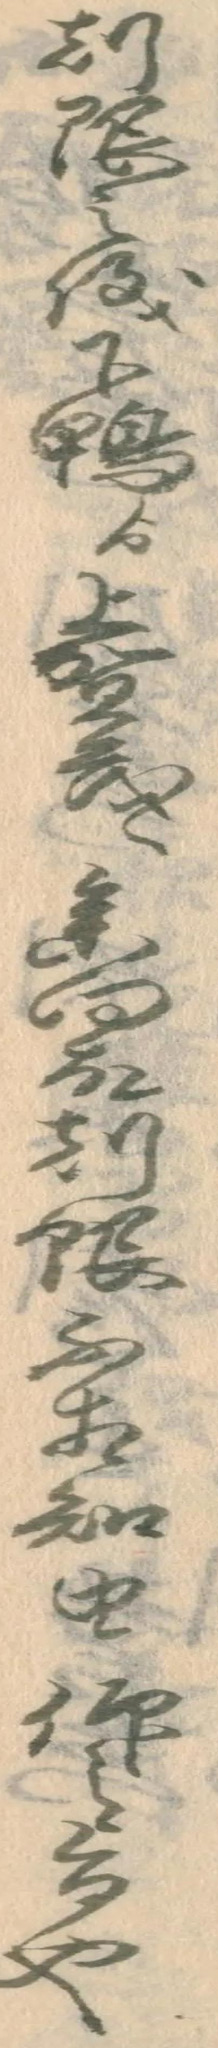刻限之儀下鴨ゟ上賀茂へ参向故刻限不相知由仰之旨也
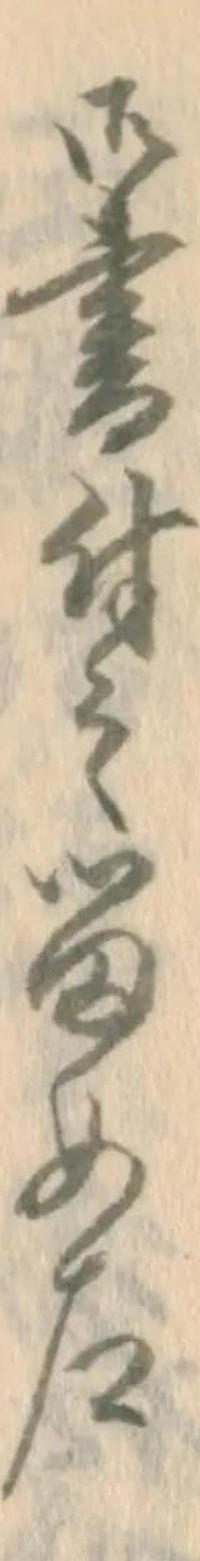御書付之留如左
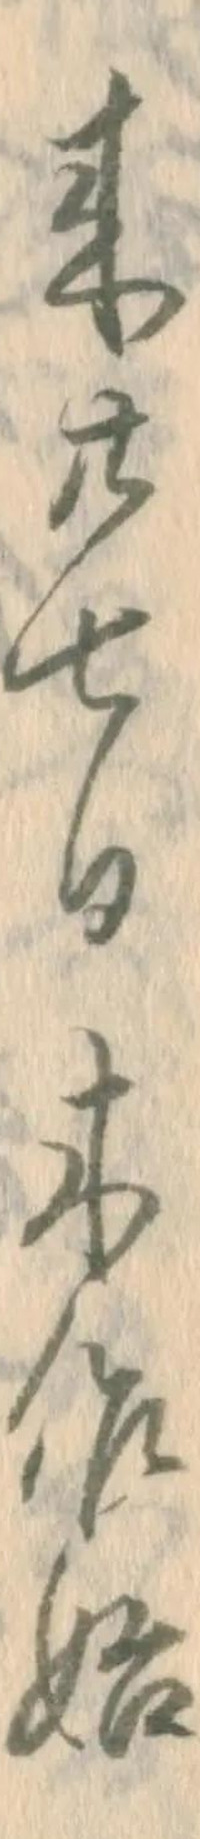来廿七日木作始
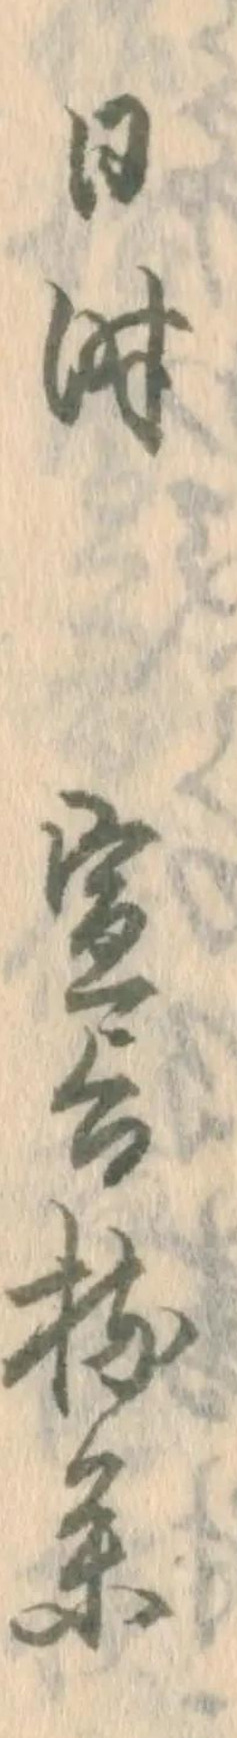日時宣旨持参
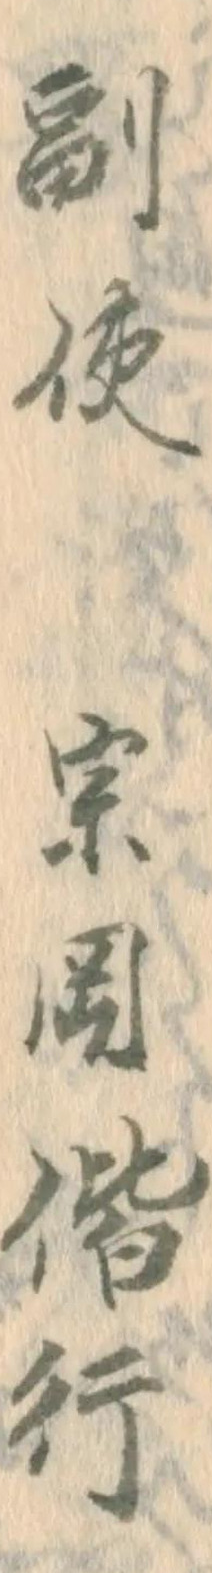副使宗岡偕行
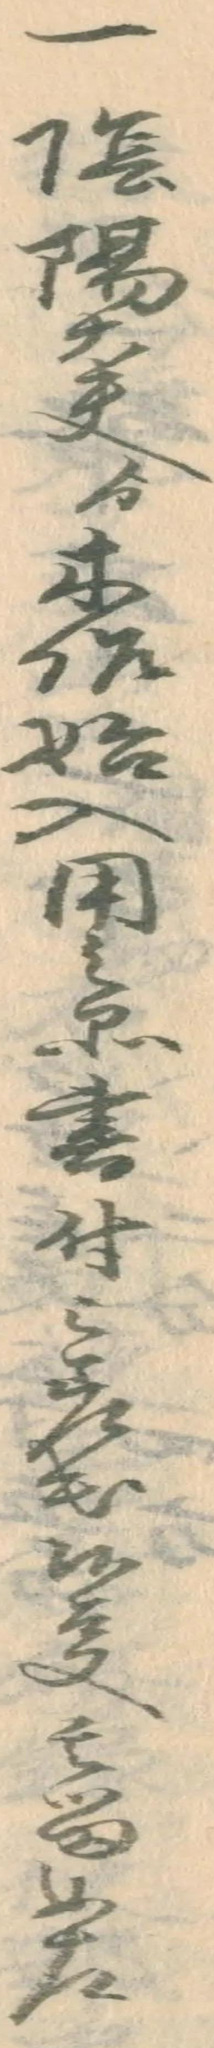一陰陽大夫ゟ木作始入用之品書付被差出候事其留如左

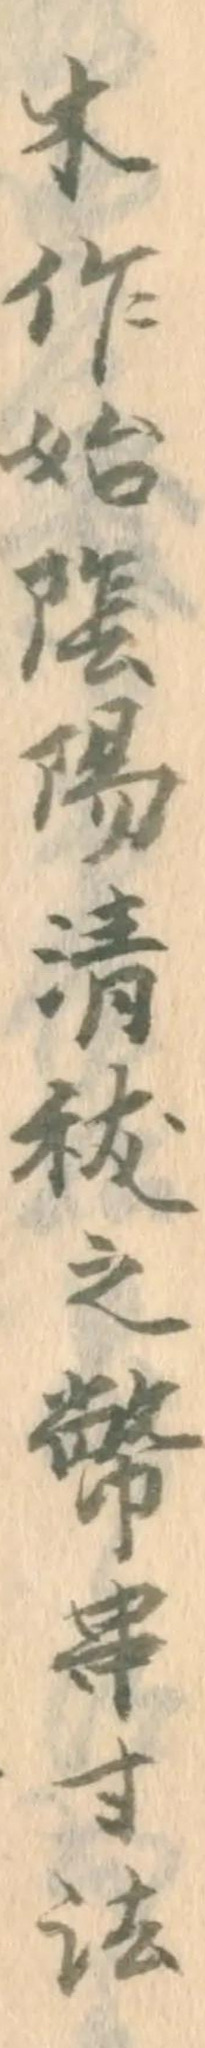木作始陰陽清祓之幣串寸法
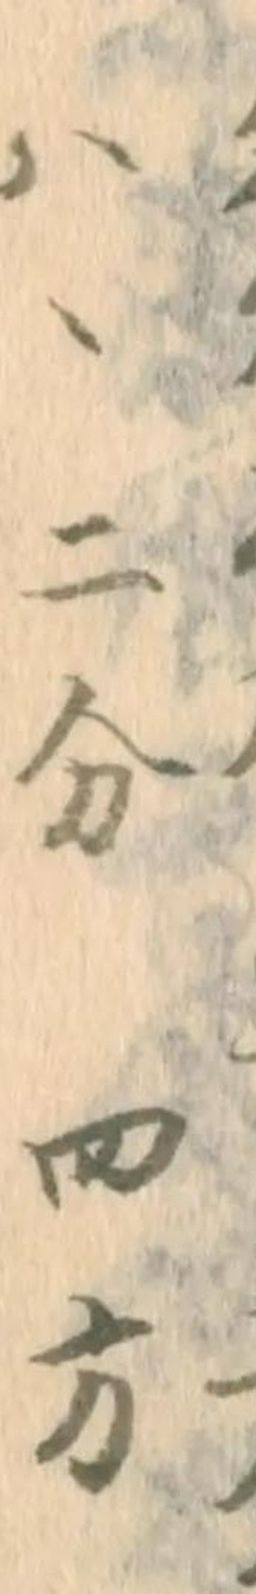ハヽ二分四方
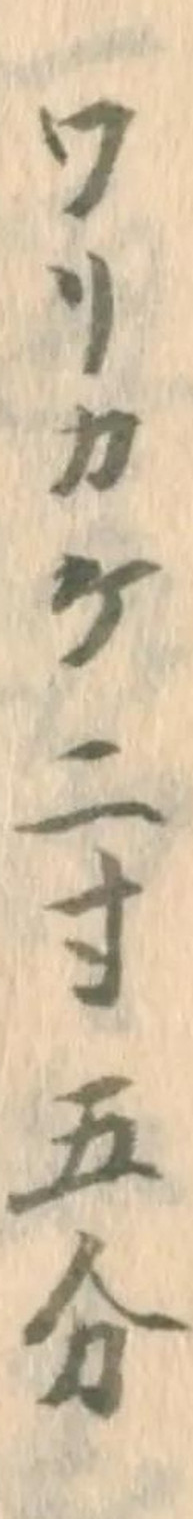ワリカケ二寸五分
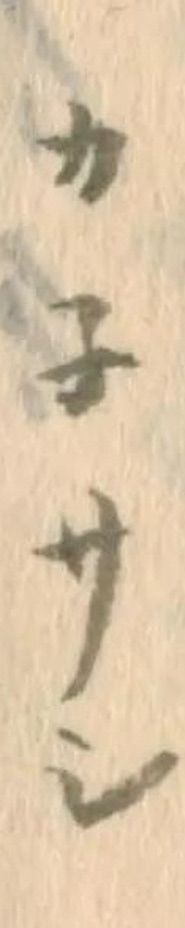カネサシ
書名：賀茂社記録. 第17冊
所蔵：国立国会図書館 National Diet Library, JAPAN
